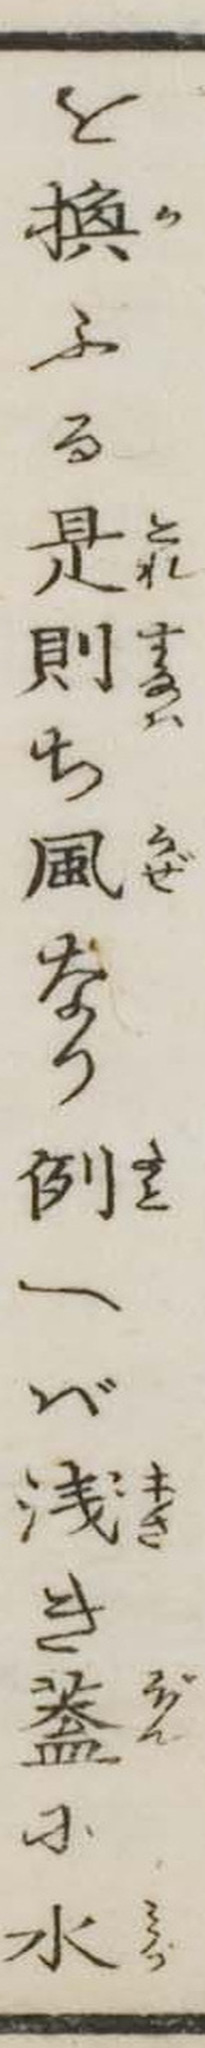を換ふる是則ち風なり例へば浅き葐に水
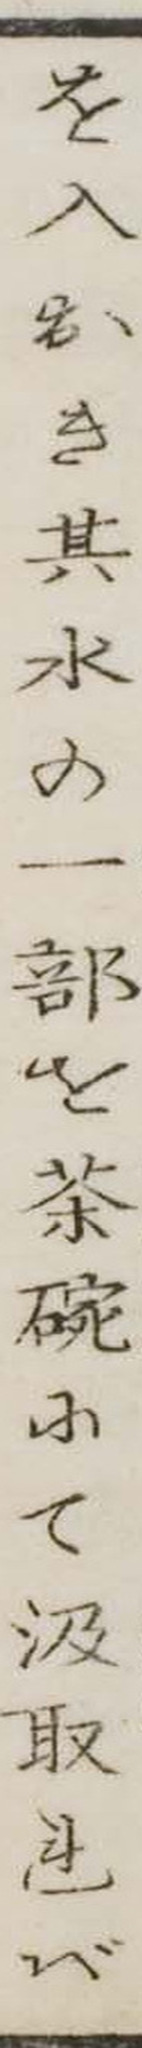を入おき其水の一部を茶碗にて汲取れば
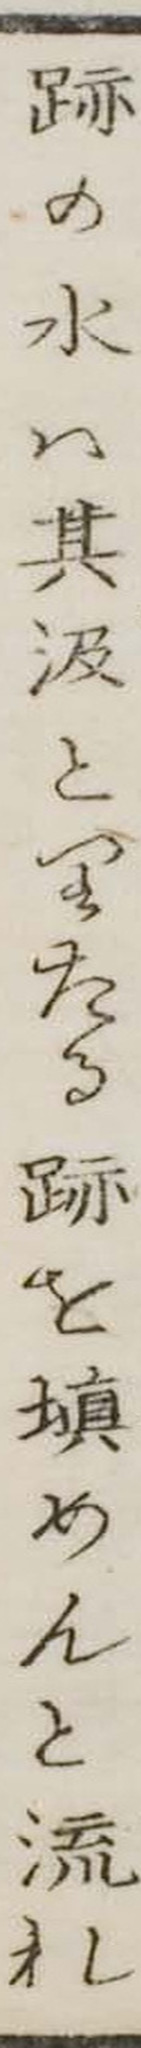跡の水は其汲とりたる跡を填めんと流れ
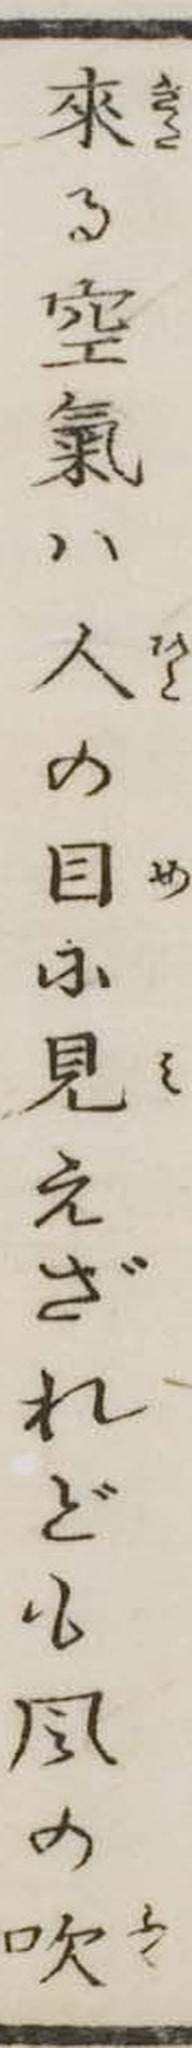來る空氣は人の目に見えざれども風の吹
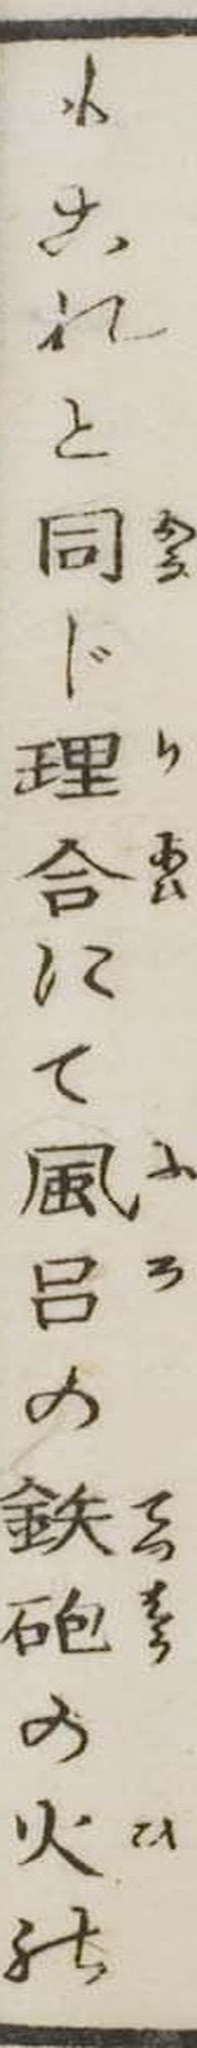もこれと同じ理合にて風呂の鉄砲の火の
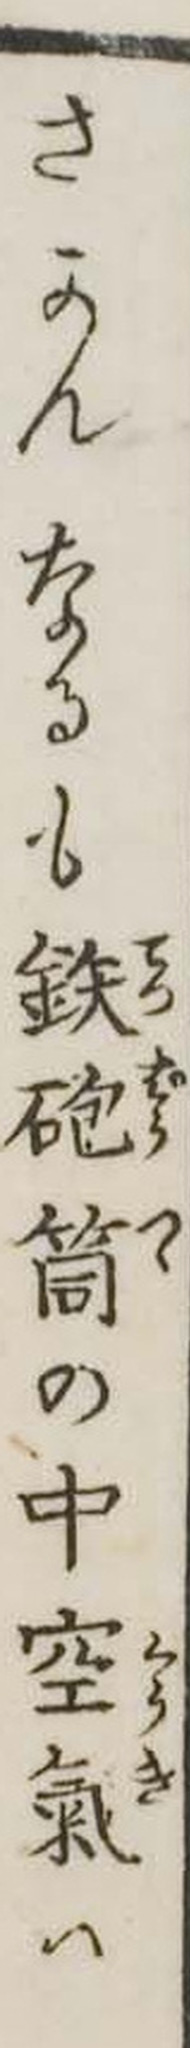さかんなるも鉄砲筒の中空氣は
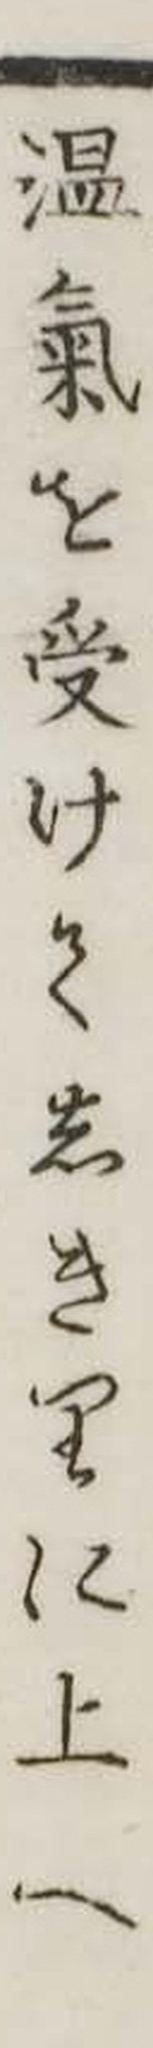温氣を受けてしきりに上へ
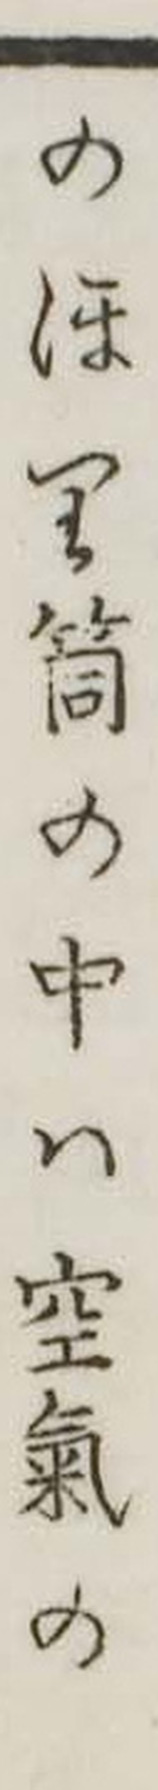のほり筒の中は空氣の
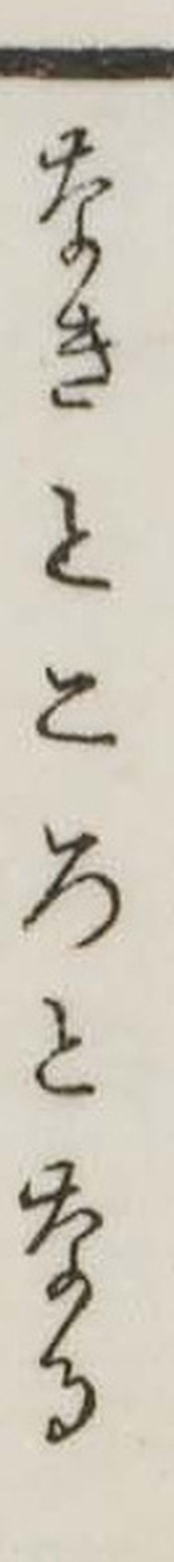なきところとなる
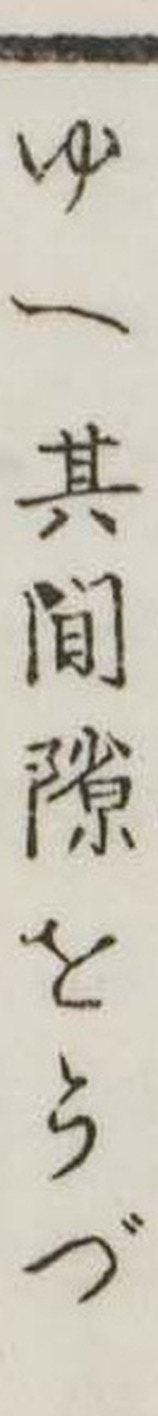ゆへ其間隙うづ
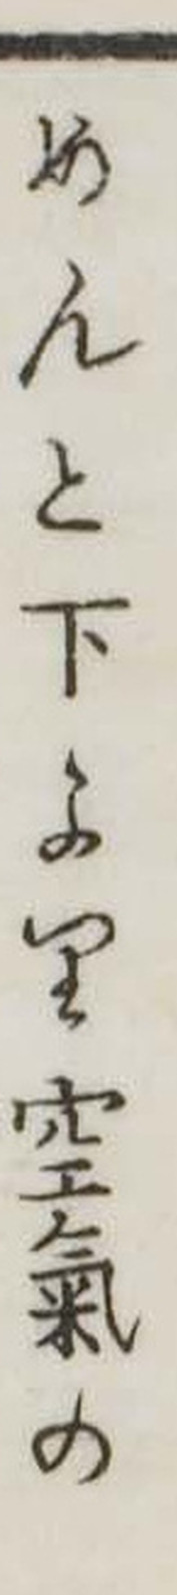めんと下より空氣の
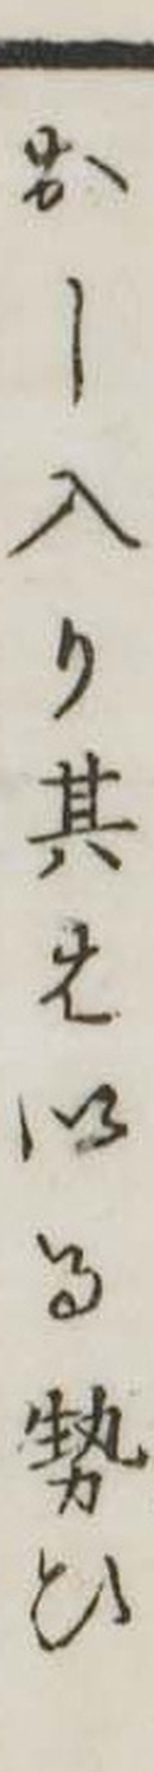おし入り其はいる㔟ひ
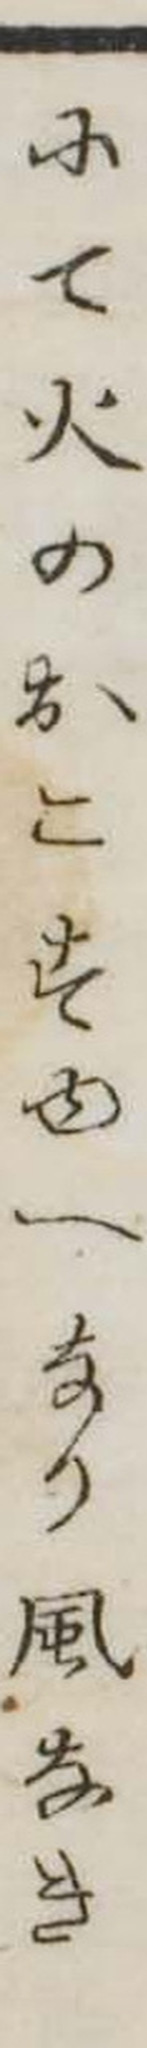にて火のおこすゆへなり風なき

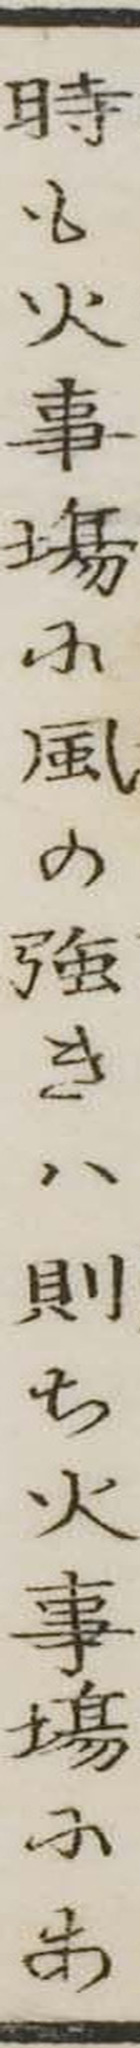時も火事塲に風の強き則ち火事塲にあ
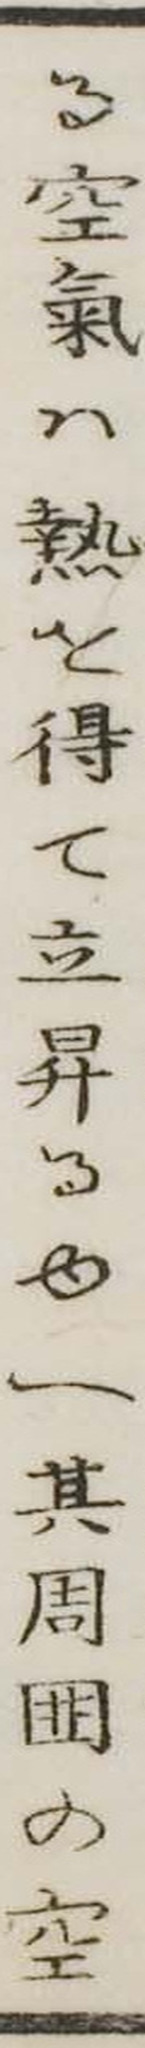る空氣は熱を得て立昇るゆへ其周囲の空
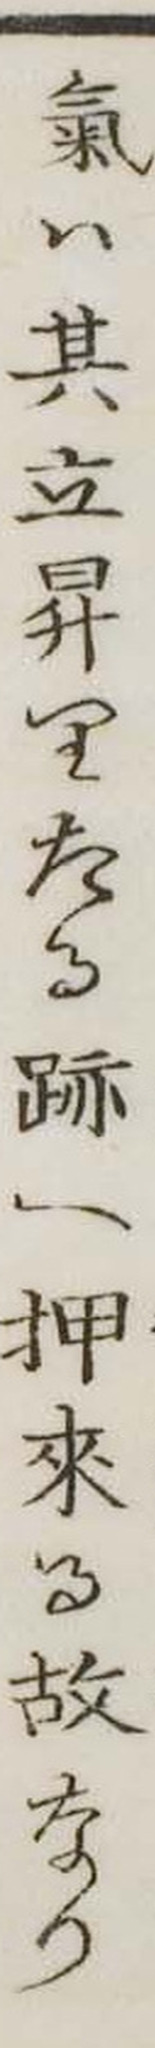氣は其立昇りたる跡へ押來る故なり
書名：究理知慧の勧 : 訓蒙画入 巻之2
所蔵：東京学芸大学附属図書館
